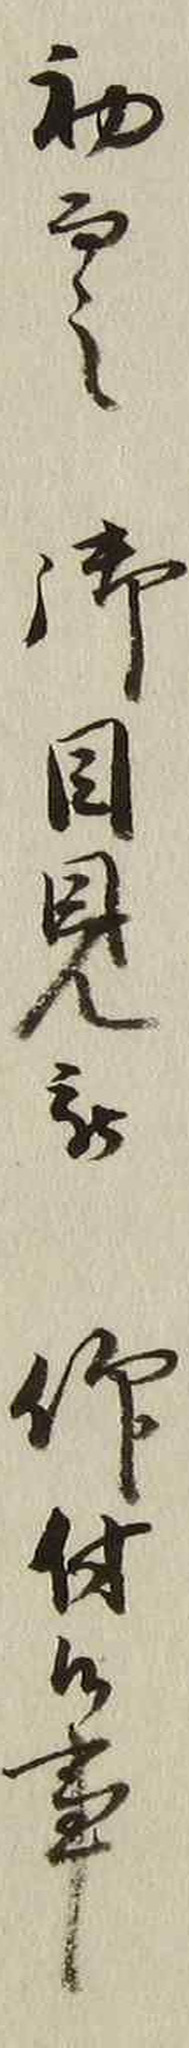初而之御目見被仰付候事
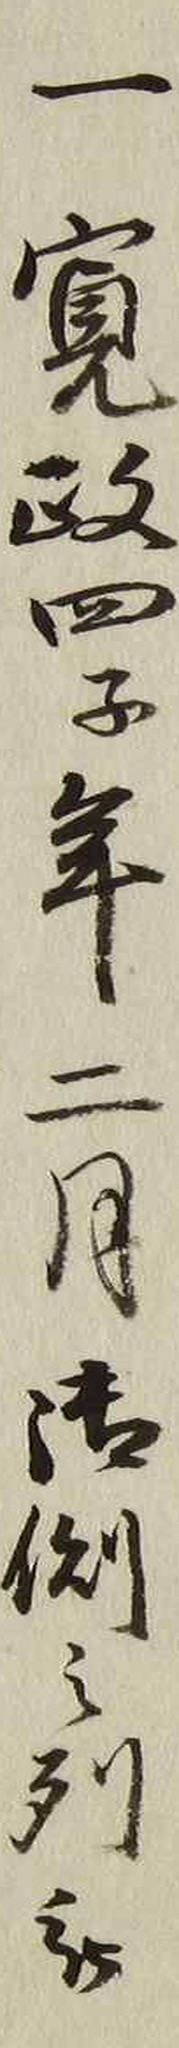一寛政四子年二月御側之列被
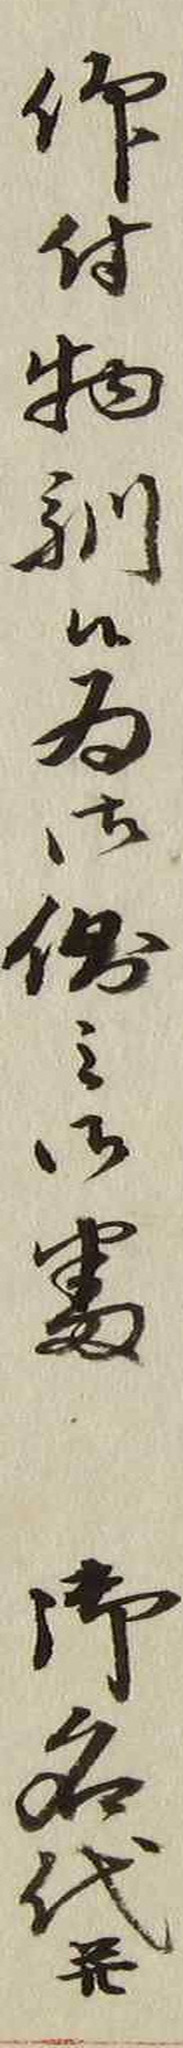仰付物馴候為御側之御番御名代并
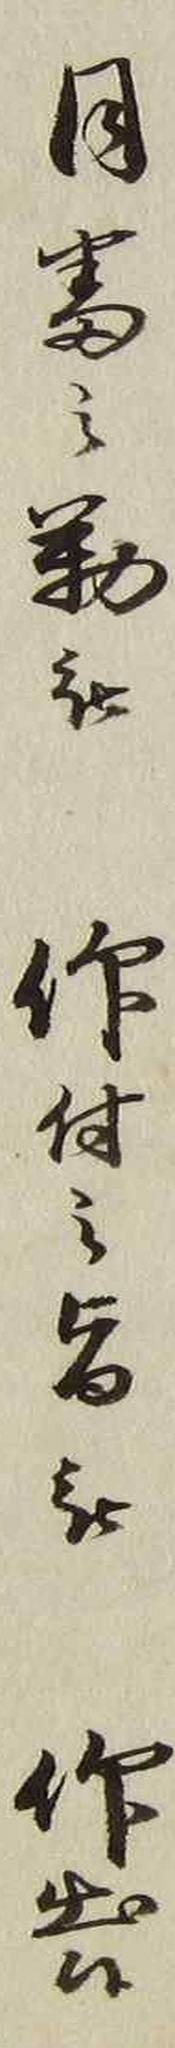月番之勤被仰付之旨被仰出候
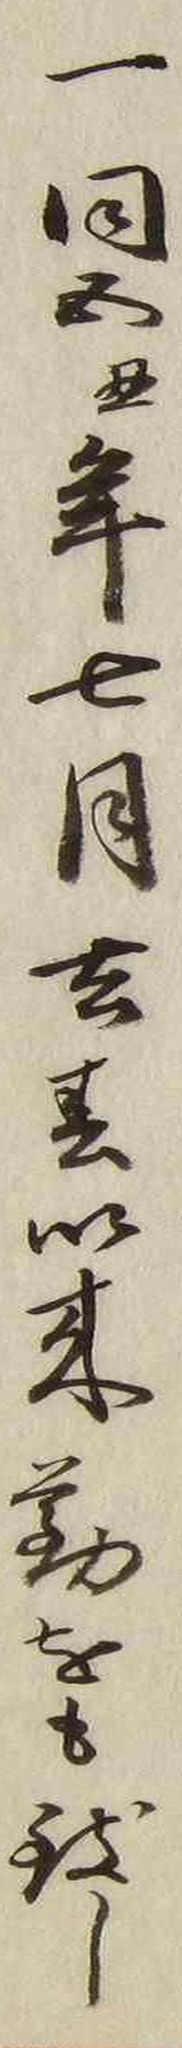一同五丑年七月去春以来勤をも致し
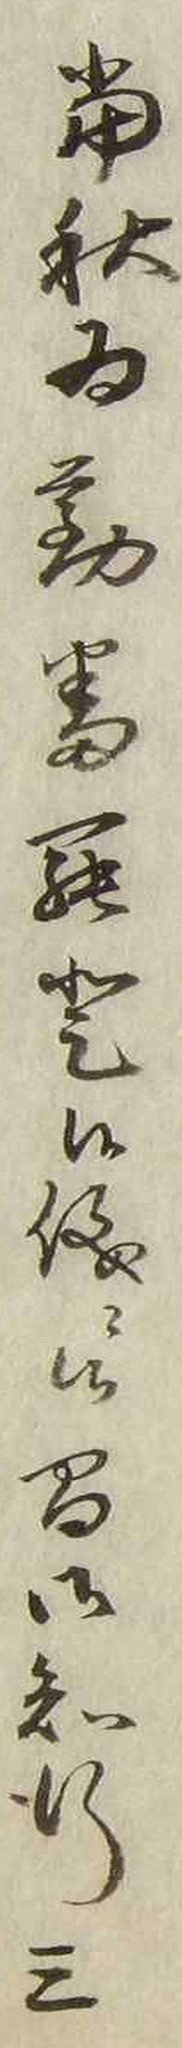当秋為勤番罷登候儀に候間御知行三

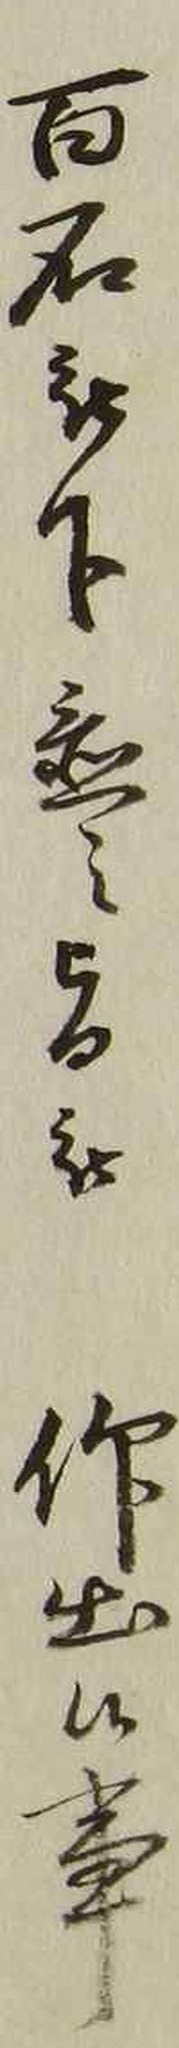百石被下置之旨被仰出候事
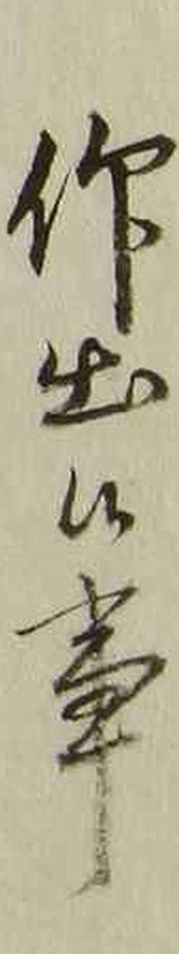仰付候事
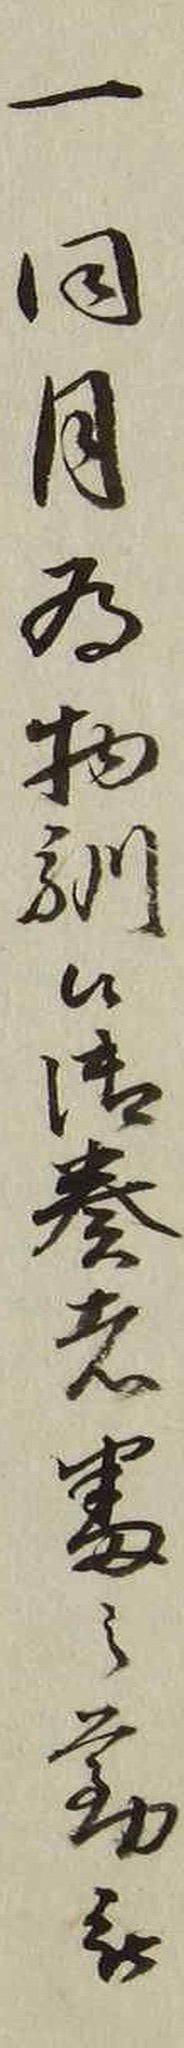一同月為物馴候御奏者番之勤被
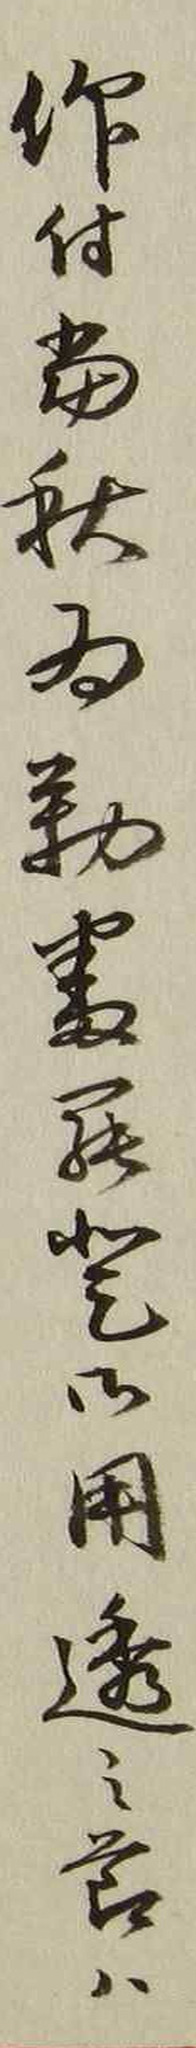仰付当秋為勤番罷登御用透之節は
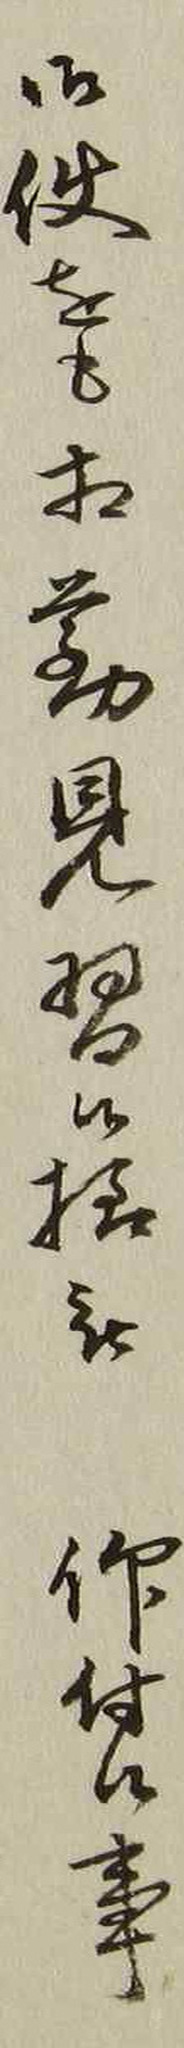御使をも相勤見習候様被仰付候事
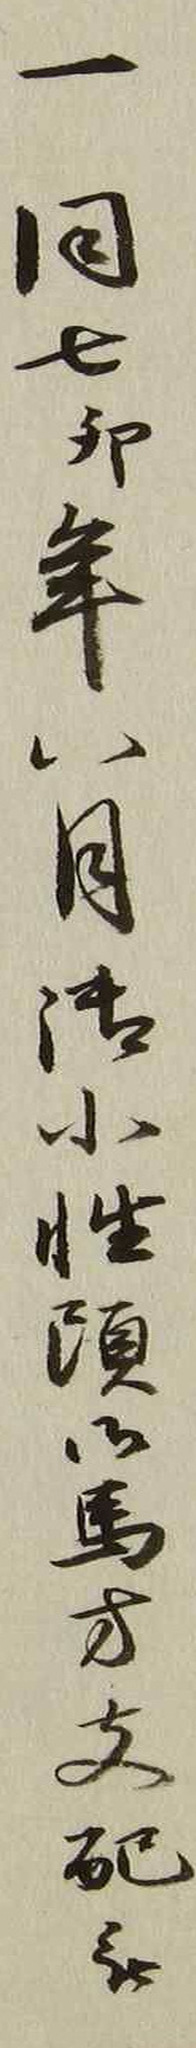一同七卯年八月御小姓頭御馬方支配被
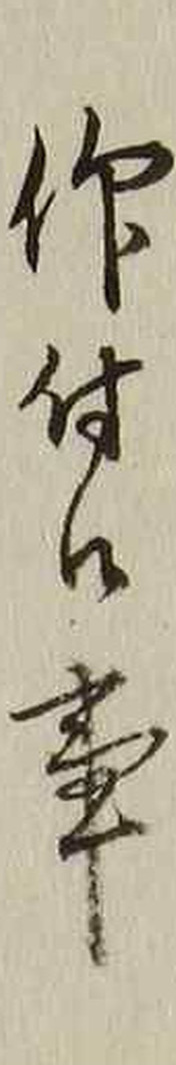仰付候事
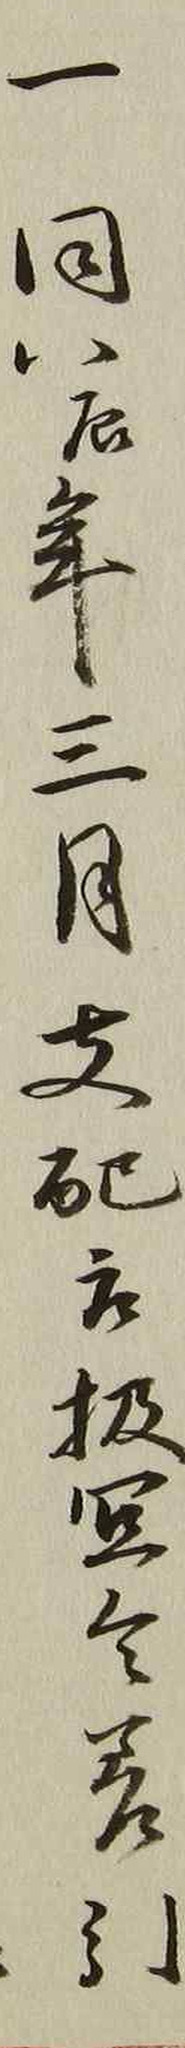一同八辰年三月支配取扱宜令差引
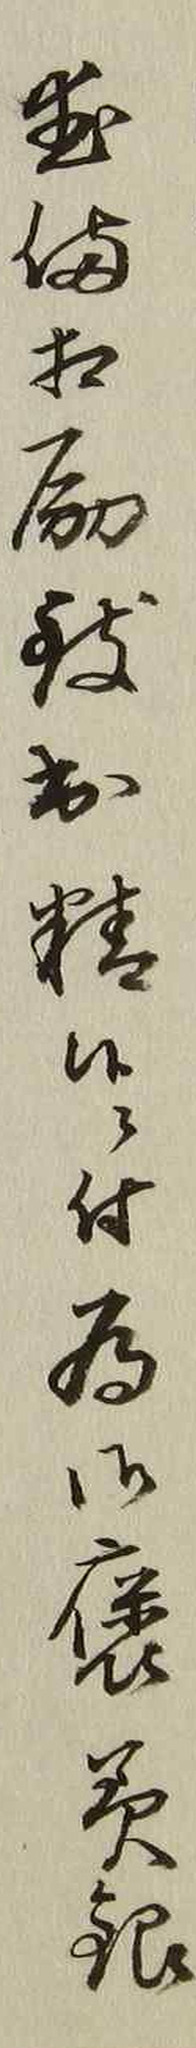至備相励致出精候に付為御褒美銀
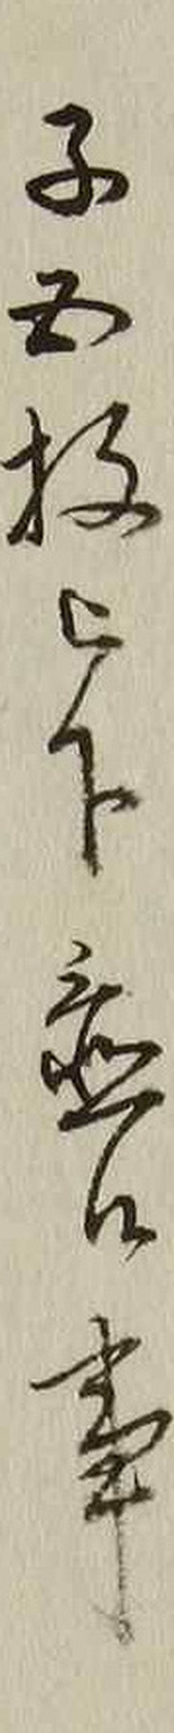子五枚被下置候事
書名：諸士系譜　巻之125　た之部1
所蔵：会津若松市立会津図書館
